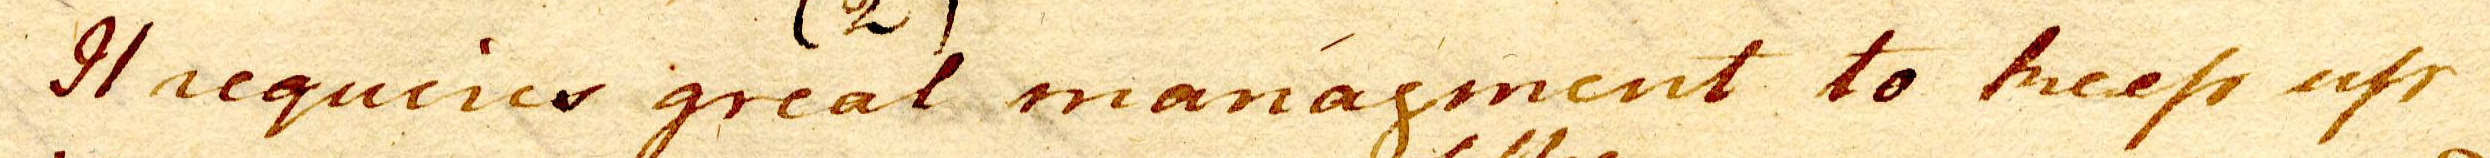It requires great managment to keep up
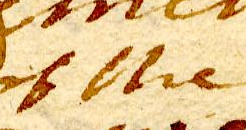of the
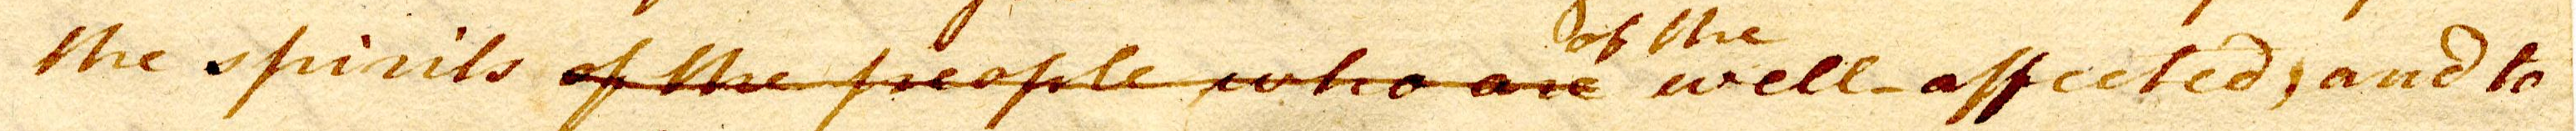the spirits [of the people who are] well affected, and to
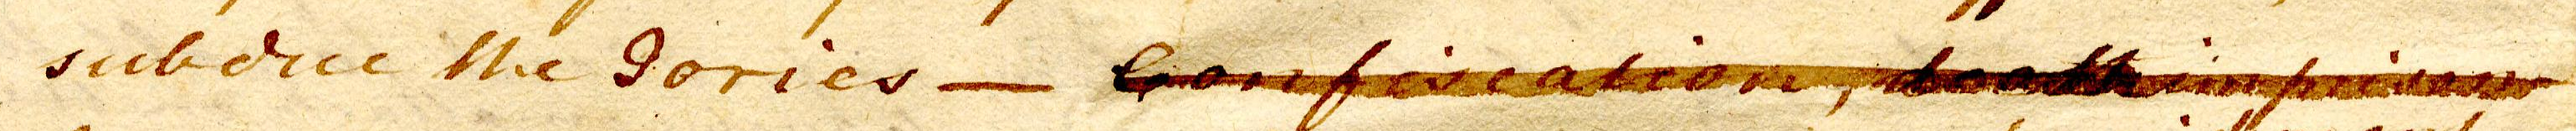subdue the Tories- [Confiscation, death imprison]
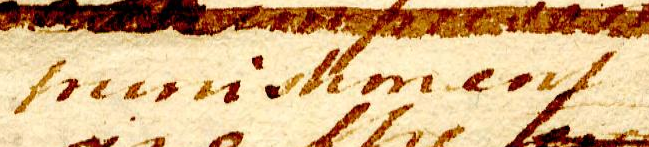punishment
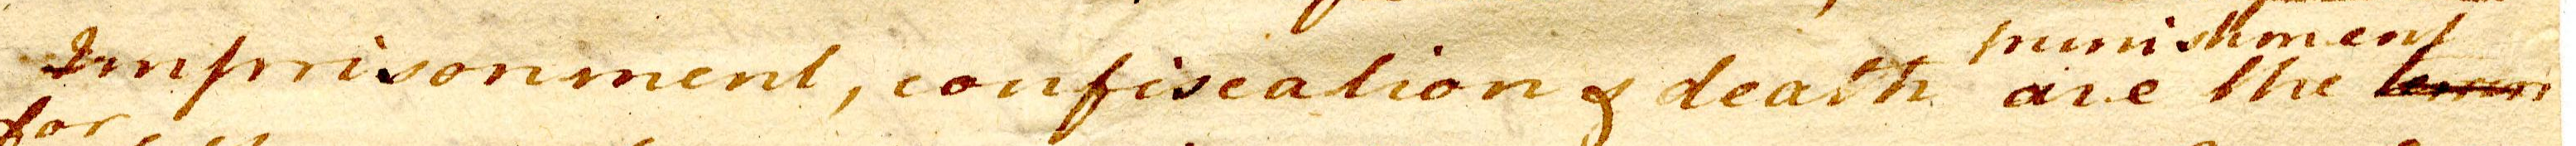Imprisonment, confiscation & death are the [terror]
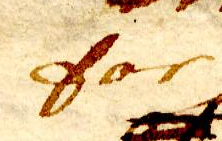for
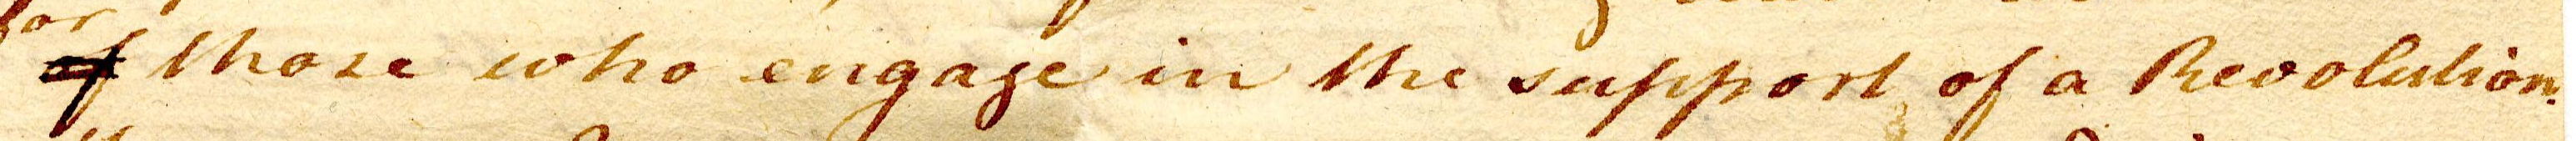[of] those who engage in the support of a Revolution
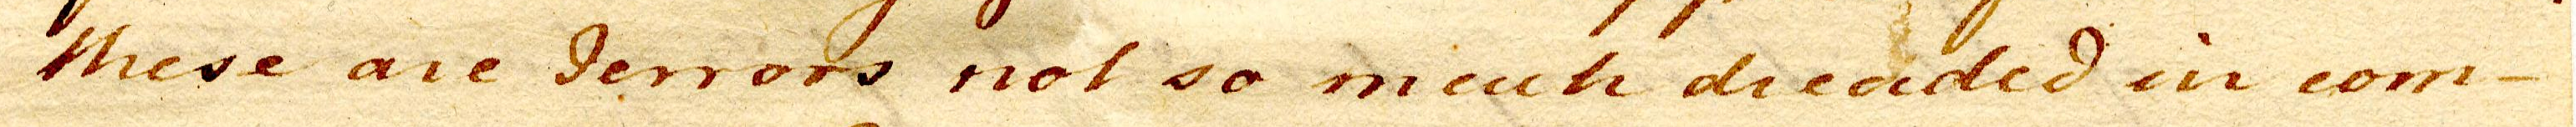these are terrors not so much dreaded in com-
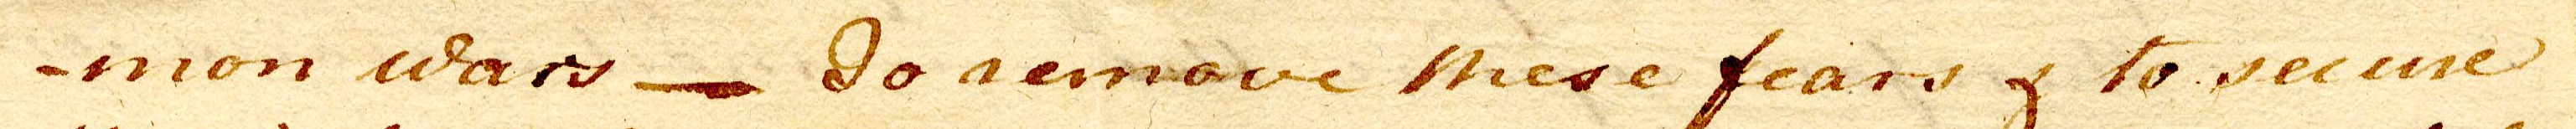-mon wars- To remove these fears & to secure
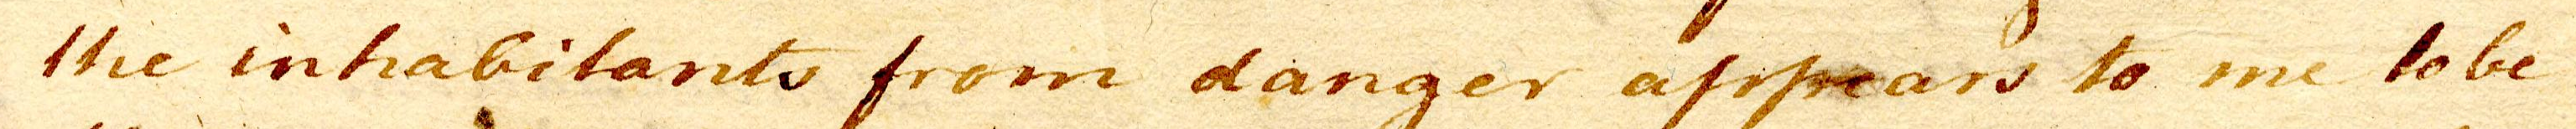the inhabitants from danger appears to me to be
